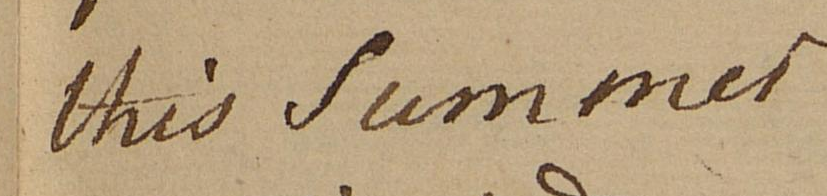this Summer
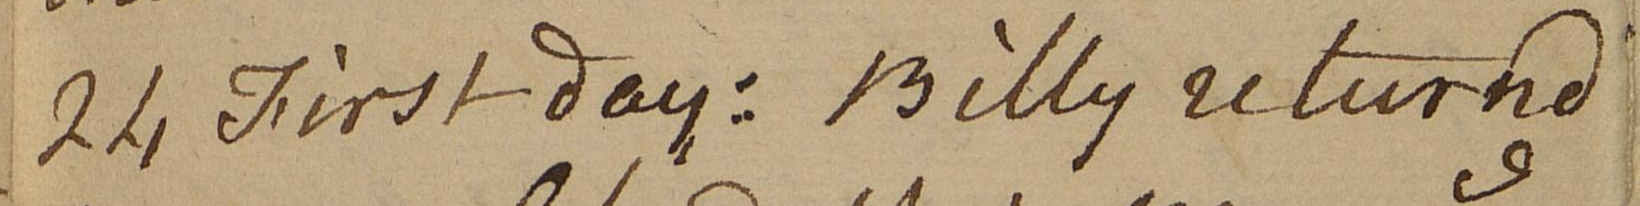24 First day: Billy returnd
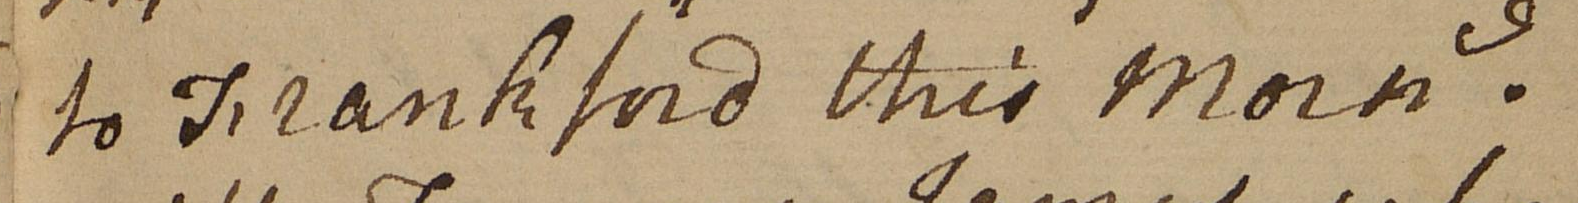to Frankford this morn^g.
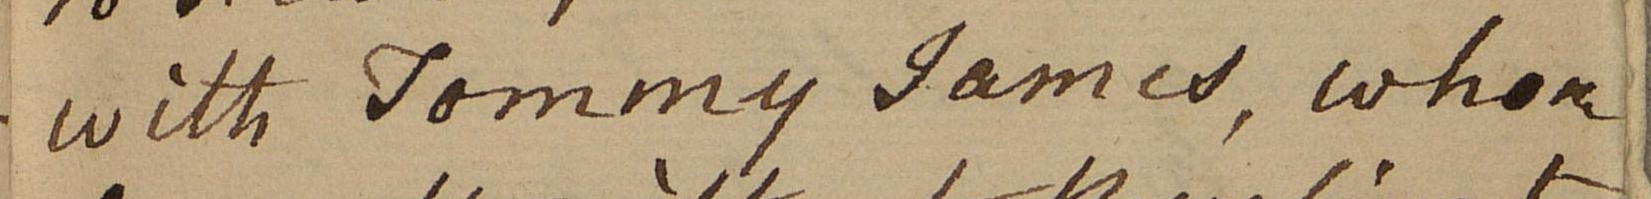with Tommy James, whom
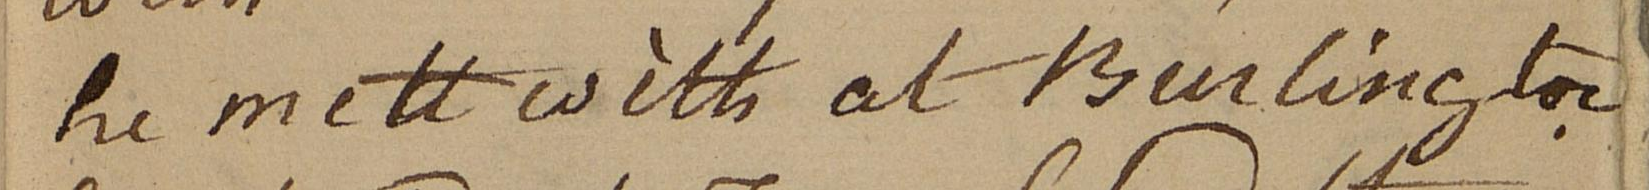he mett with at Burlington
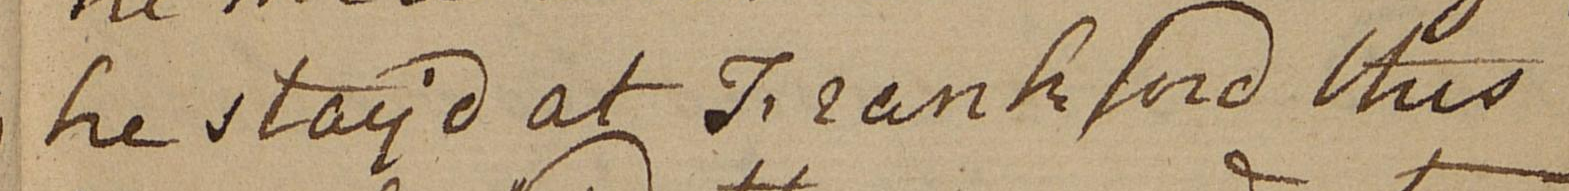he stay'd at Frankford this
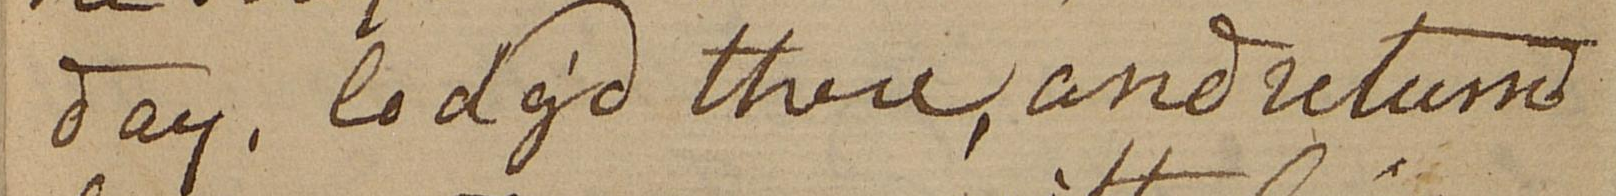day, lodg'd there, and returnd
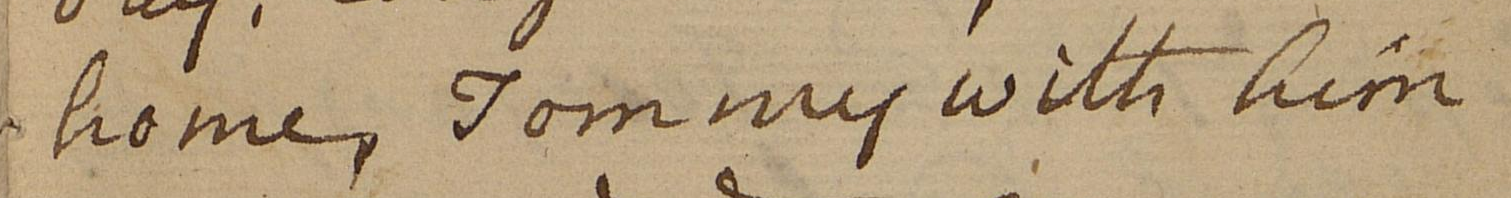home, Tommny with him
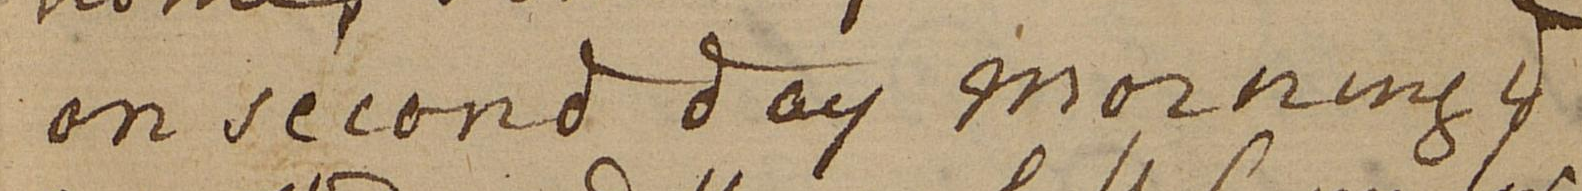on second day morning y^e
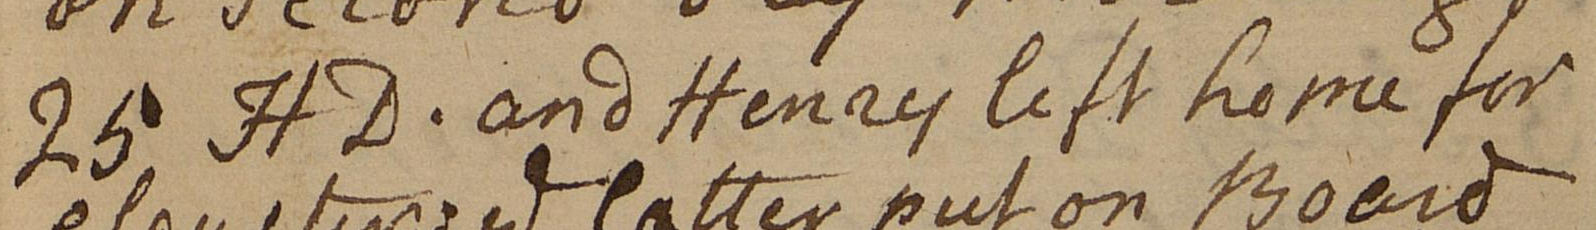25. HD. and Henry left home for
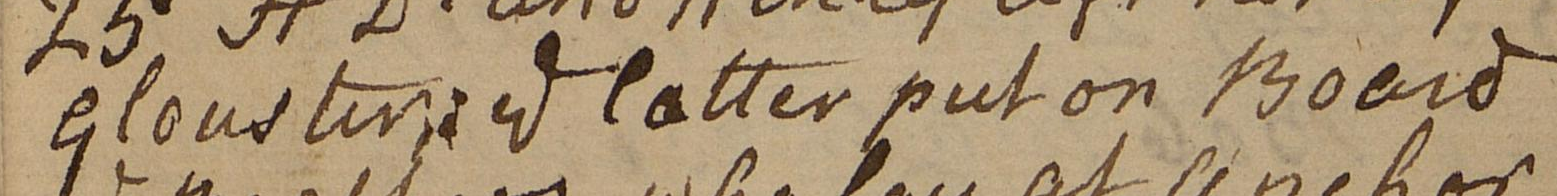Glouster: y^e latter put on Board
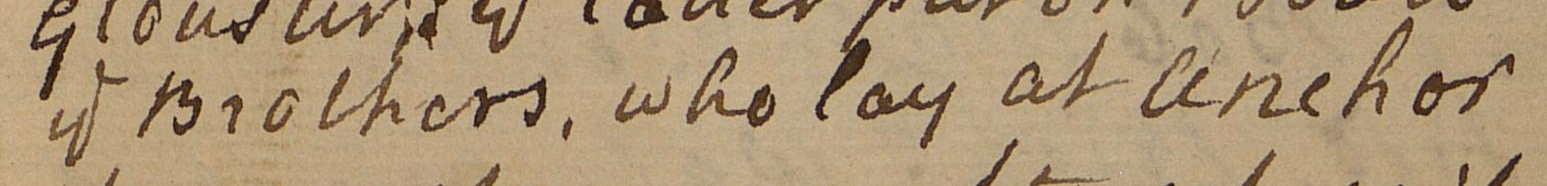y^e Brothers, who lay at Anchor
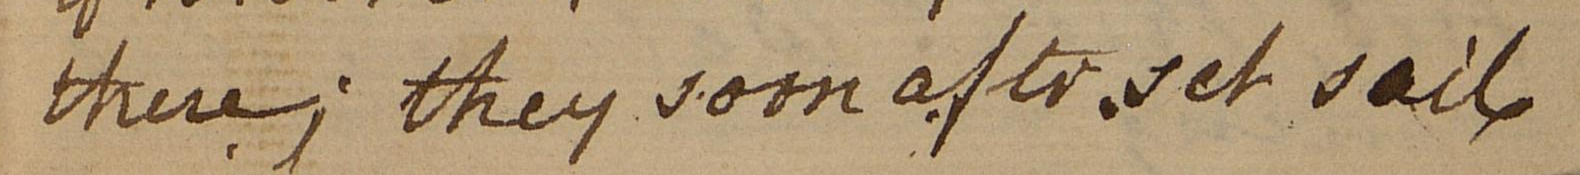there; they soon after set sail
